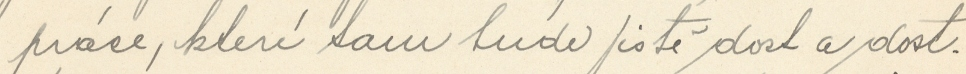práce, které tam bude jistě dost a dost.
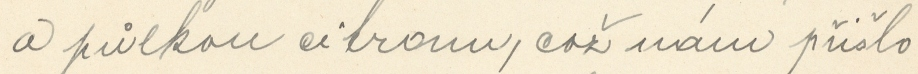a půlkou citronu, což nám přišlo
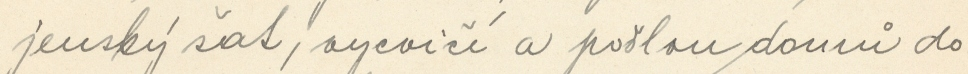jenský šat, vycvičí a pošlou domů do
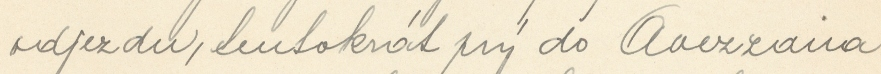odjezdu, tentokrát prý do Avezzana
